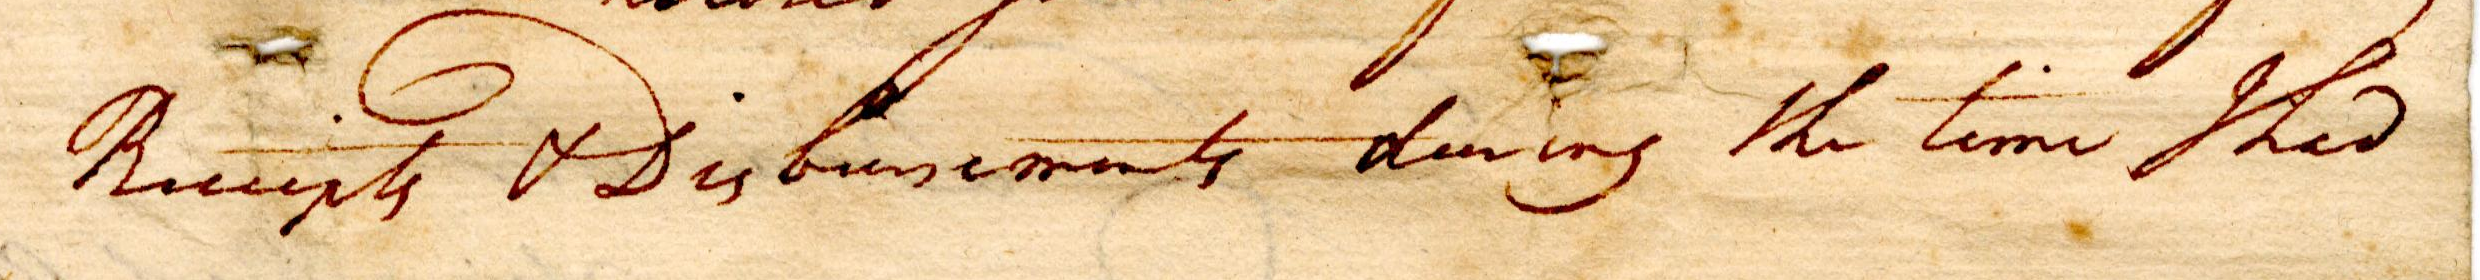Receipts & Disbursements during the time I had
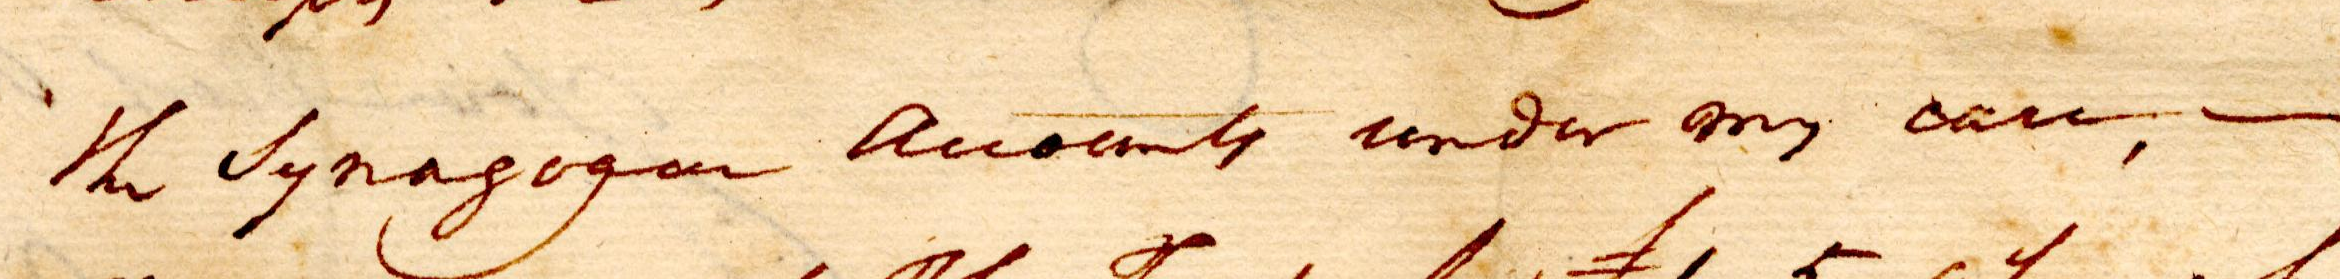the Synagogue Accounts under my care,-
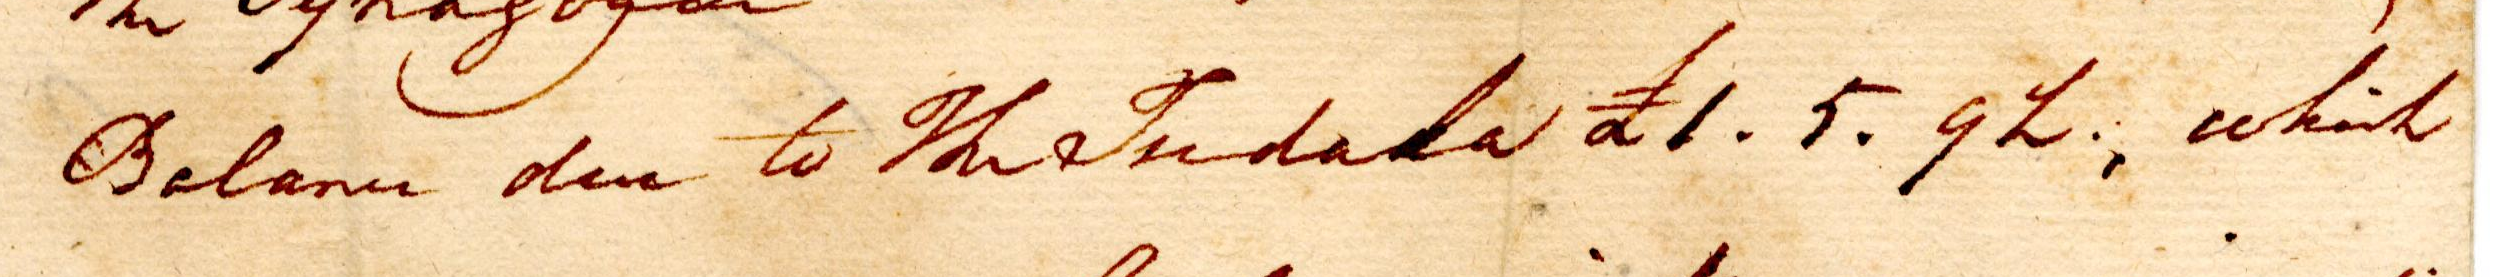Balance due to The Indala £1.5. 9L, which
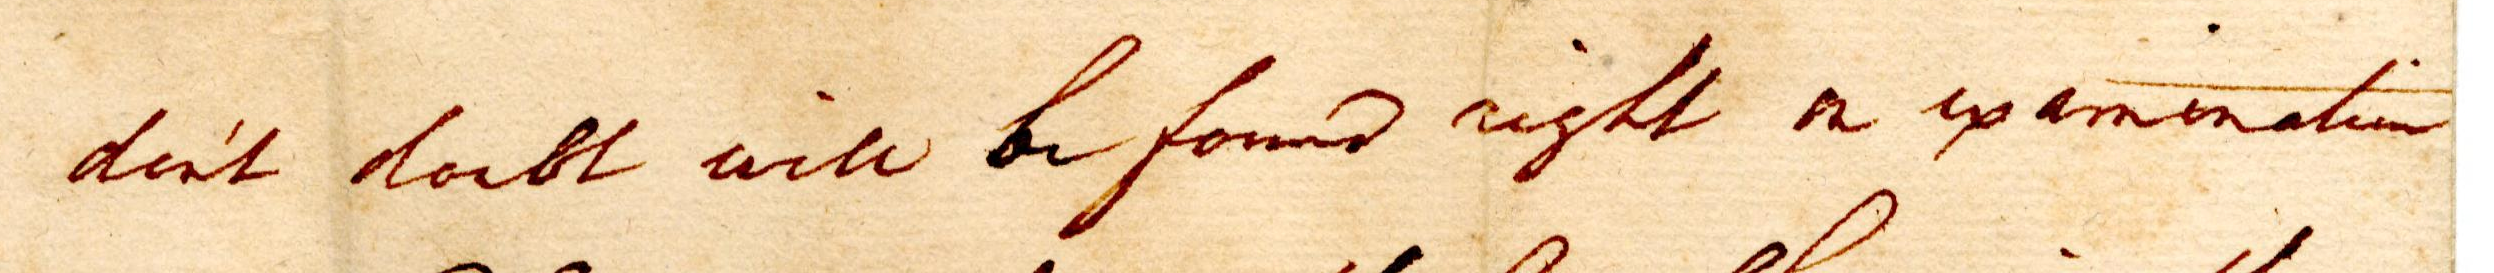don't doubt will be found right on examination
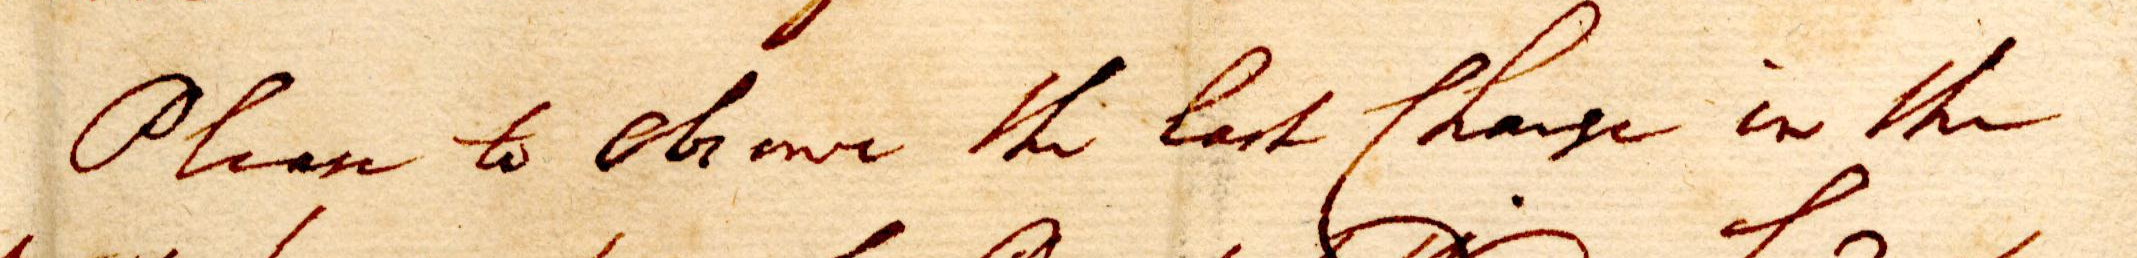Please to Observe the last Charge in the
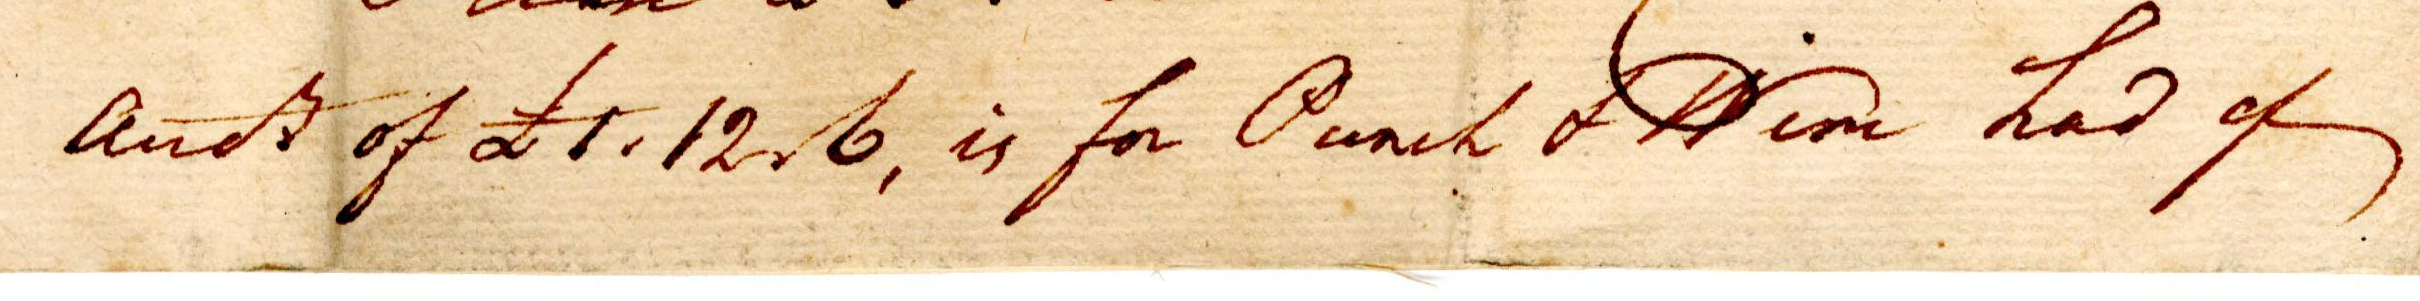Acco^t of £1.12.6 is for Punch & Wine had of
